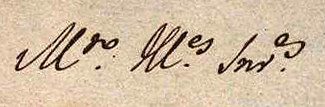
Mto. Ill.es Snr.es
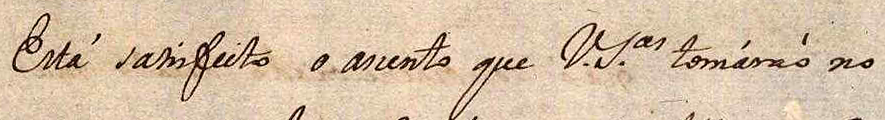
Está satisfeito o assento que V. S.as tomáraõ no
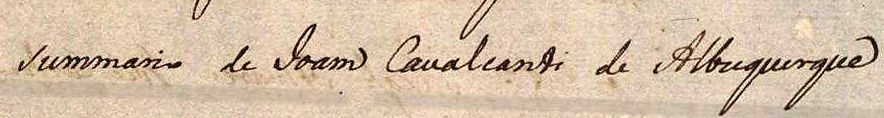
summario de Ioam Caualcanti de Albuquerque
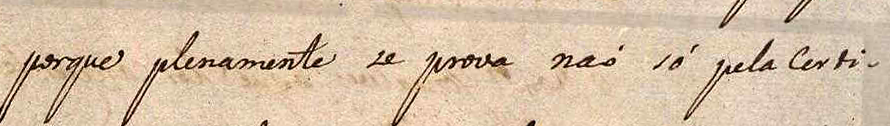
porque plenamente se prova naõ só pela certi
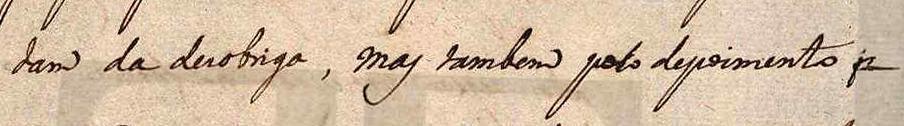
dam da desobriga, mas tambem pelo depoimento ṗ
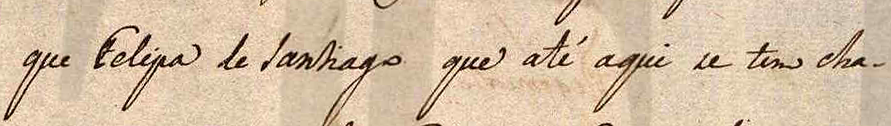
que Felipa de Santiago que até aqui se tem cha
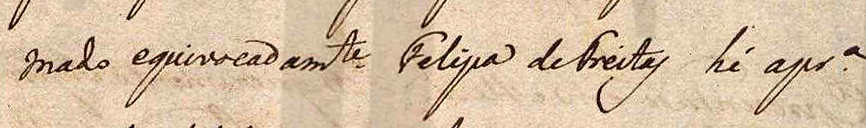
mado equivocadam.te Felipa de Freitas hé a pr.a
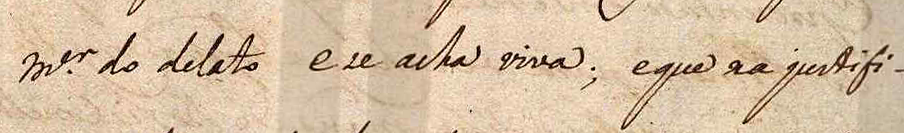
m.er do delato e se acha viva; e que na justifi
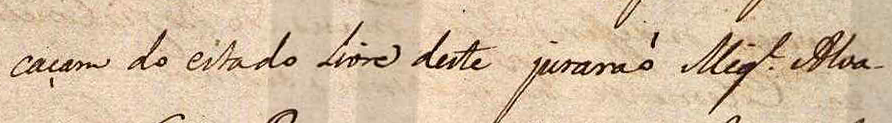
caçam do estado Livre deste juraraõ Mig.l Alva
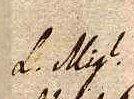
L. Mig.l
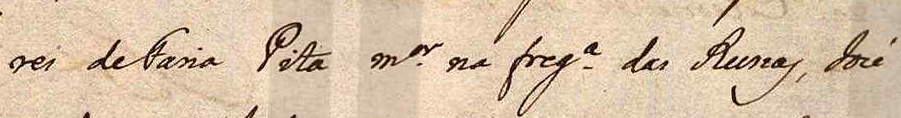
res de Faria Pita m.or na freg.a das Russas, Iozé
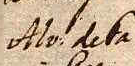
Alv. de Fa
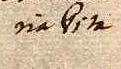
ria Pita
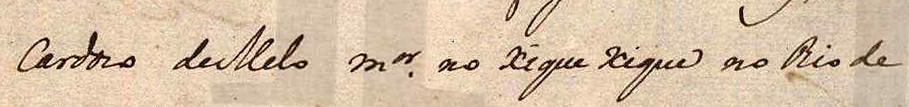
Cardozo de Melo m.or no xique xique no Rio de
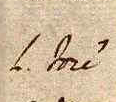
L. Iozé
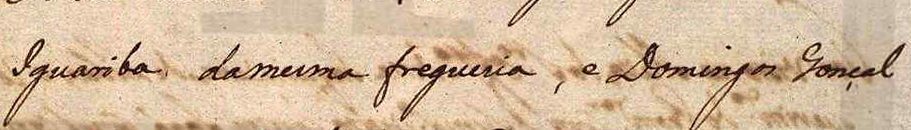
Iguariba da mesma freguezia, e Domingos Gonçal
